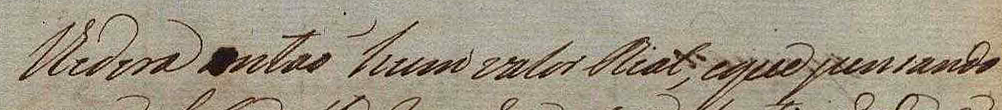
lhe dera entaõ hum valor Rial; e que pensando
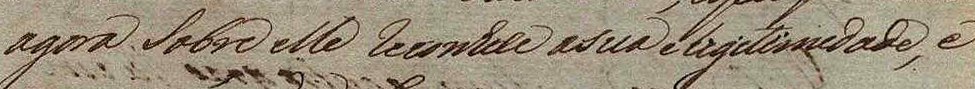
agora Sobre elle Reconhece a sua eligitimidade, e
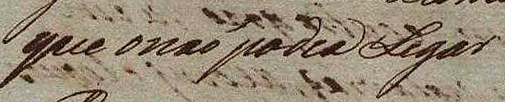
que o naõ podia Legar
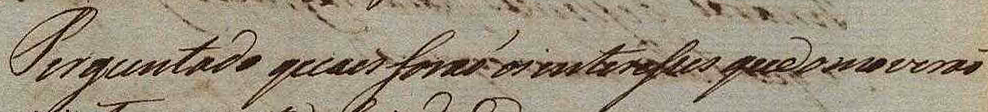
Perguntado quaes foraõ os interesses que o moveraõ
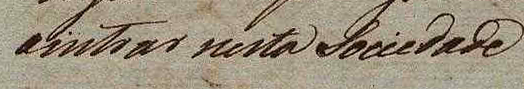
a intrar nesta Sociedade
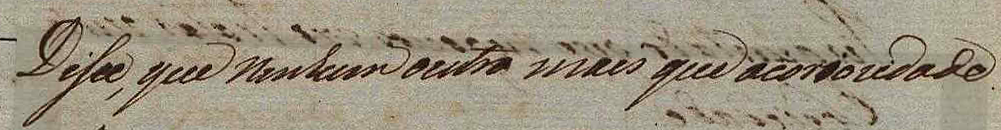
Disse, que nenhum outro mais que a coriozidade
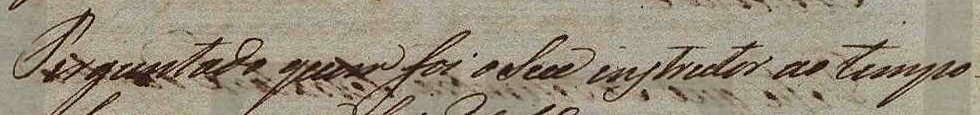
Perguntado quem foi o seu instrutor ao tempo
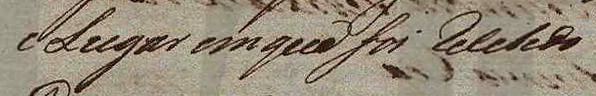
e Lugar em que foi Recebedo
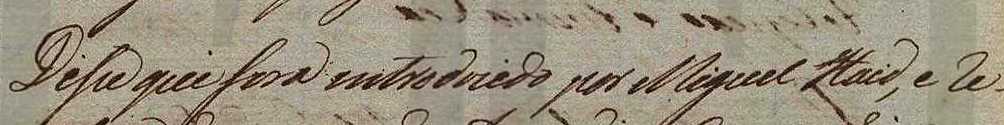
Disse que fora introdozido por Miguel Haid, e Re
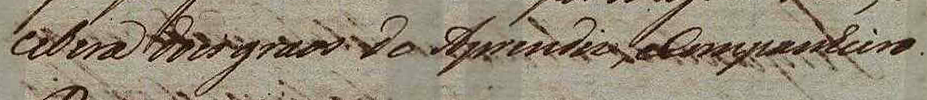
cebera dois graos do Aprendiz, e Companheiro.
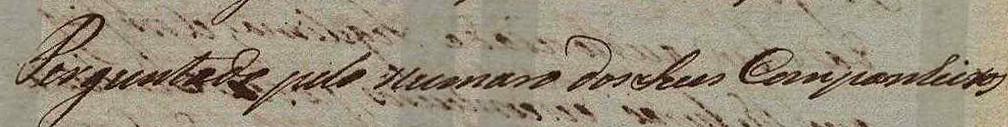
Perguntado pelo numaro dos seus Companheiros
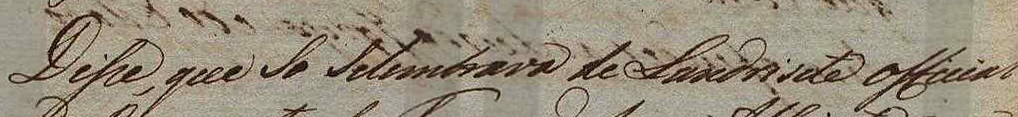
Disse, que só se lembrava de Lundrisete official
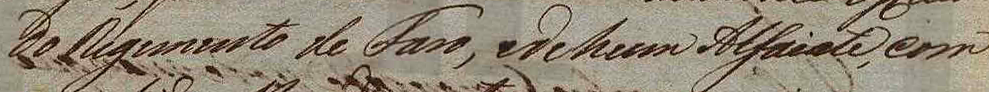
do Regimento de Faro, e de hum Alfaiate, com
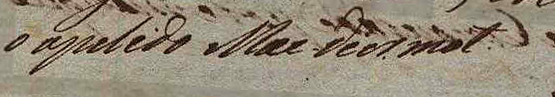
o apelido Mac diormot.
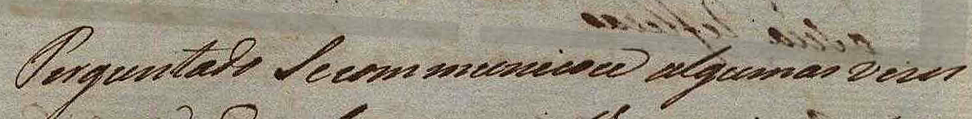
Perguntado se communicou algumas vezes
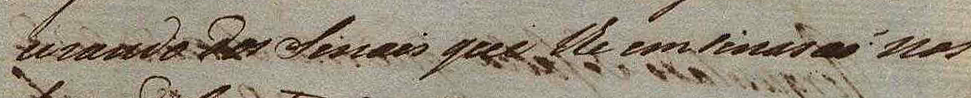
uzando dos sinais que lhe emsinaraõ nos
